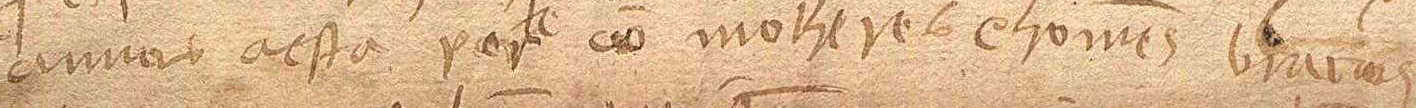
annos a esta parte cō molheres e homēs bracas
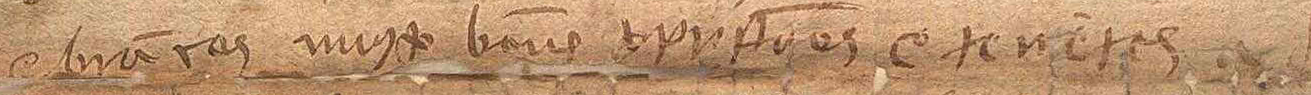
e brācos mujto bōns xpristãos e temētes a ds̄
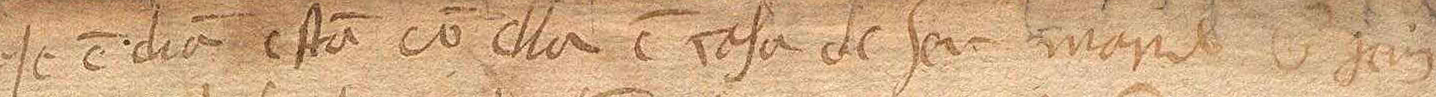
oJe ē dia estā cō ella ē casa de seu marido q̄ tem
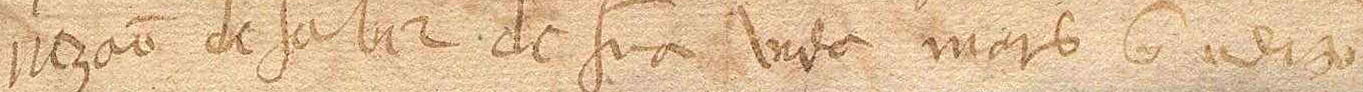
rrezaõ de saber de sua vida mais q̄ o dito
